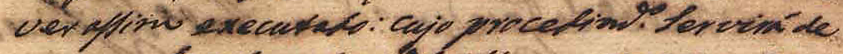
ver assim executado: cujo procedim.to servirá de
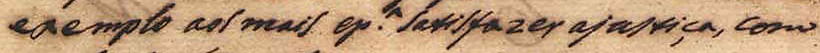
exemplo aos mais e p.a satisfazer a justiça, com
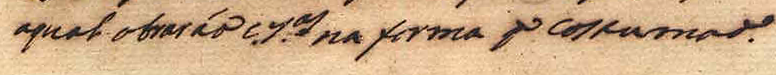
a qual obraraõ v. s.as na forma q̄ costumaõ
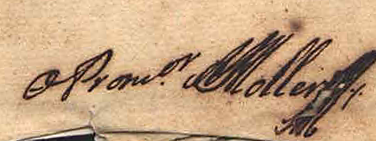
O Prom.or Moller
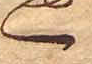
E
